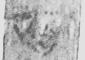百
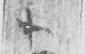十
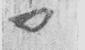四
